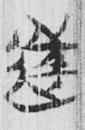○（往）
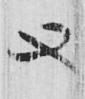又
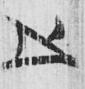之
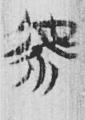{虍介}（乎）
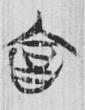合
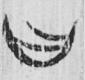曰
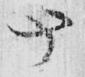又
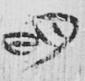明
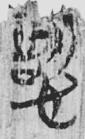○（慎）
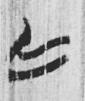㠯（以）
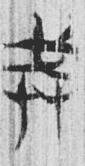戒
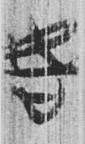○（弗）
